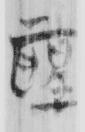聖
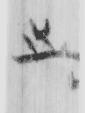之
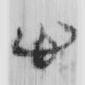心
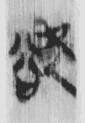欲
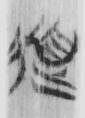道
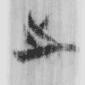之
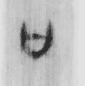口
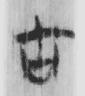古
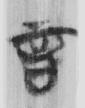言
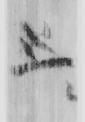之
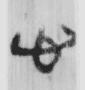心
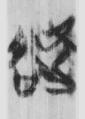欲
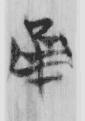甬
